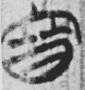○（廟）
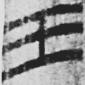王
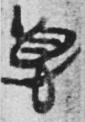惪（德）
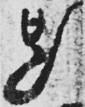也
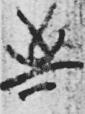至
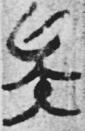矣
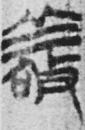敬
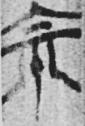宗
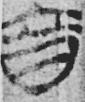○（廟）
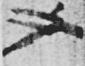之
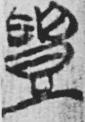豊（禮）
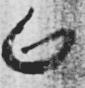㠯（以）
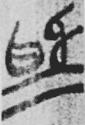爲
